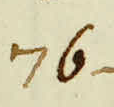76
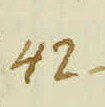42
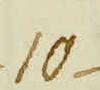10
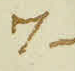7
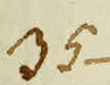35
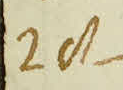28
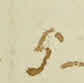5
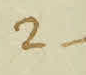2
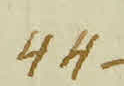44
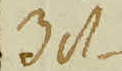38
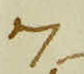7
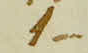1
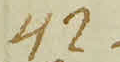42
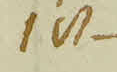18
